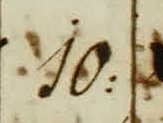10:
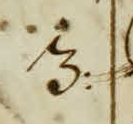3:
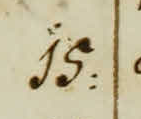15:
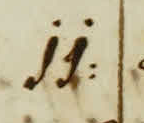11:
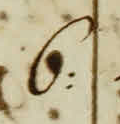6:
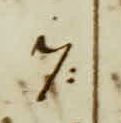7:
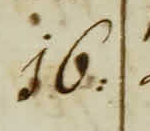16:
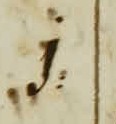1:
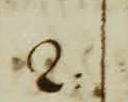2:
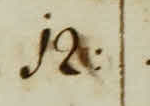12:
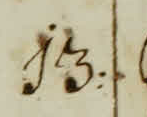13:
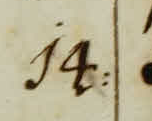14:
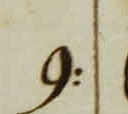9:
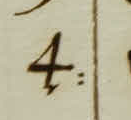4:
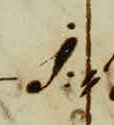1:
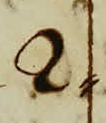2
